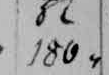180
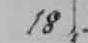18
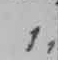1
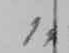1
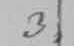3
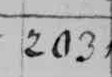203
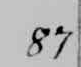87
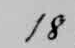18
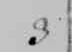3
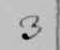3
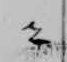2
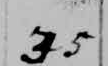35
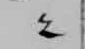2
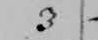3
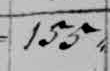155
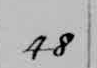48
